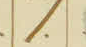1.
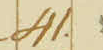41.
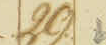29.
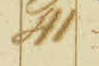41
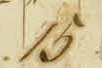15
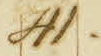41
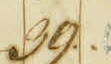39.
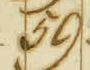59
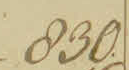830.
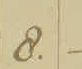8.
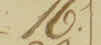16.
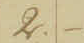2.
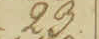23.
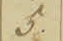5.
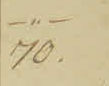70.
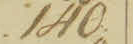140.
